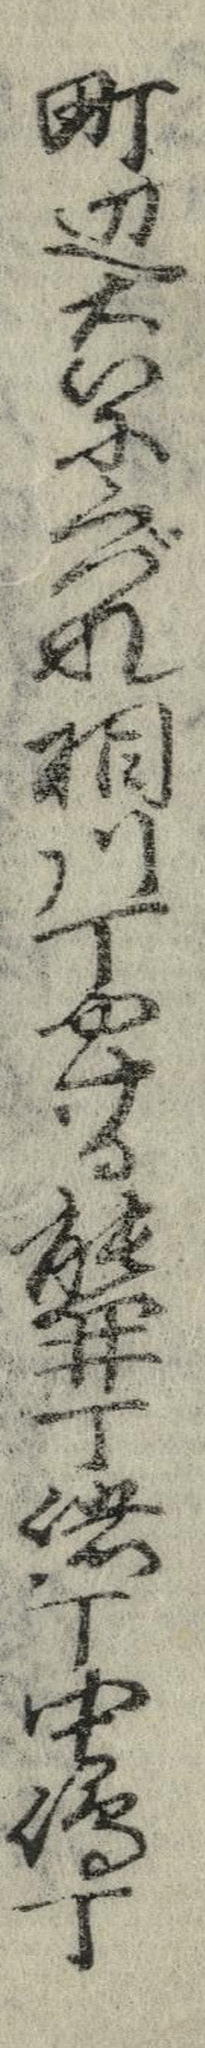町辺大いにくづれ相川丁やける熊井丁緒丁中嶋丁
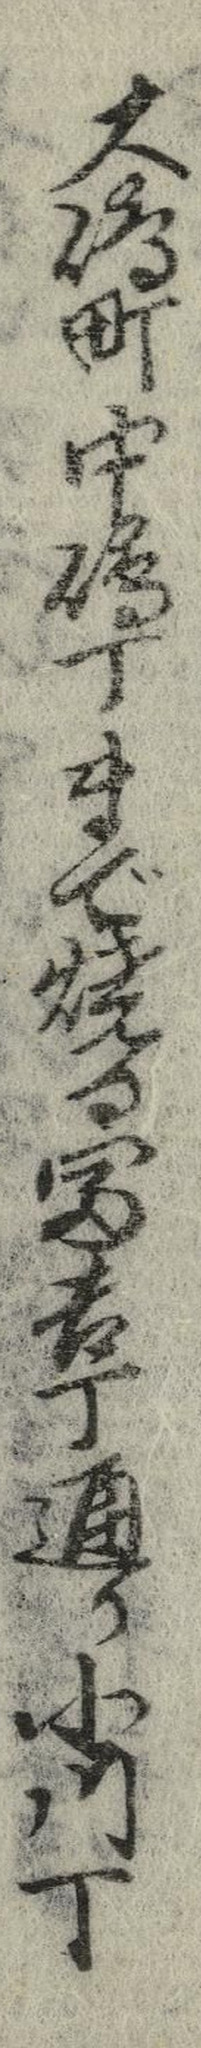大嶋町中嶋丁まで焼る富吉丁通り小川丁
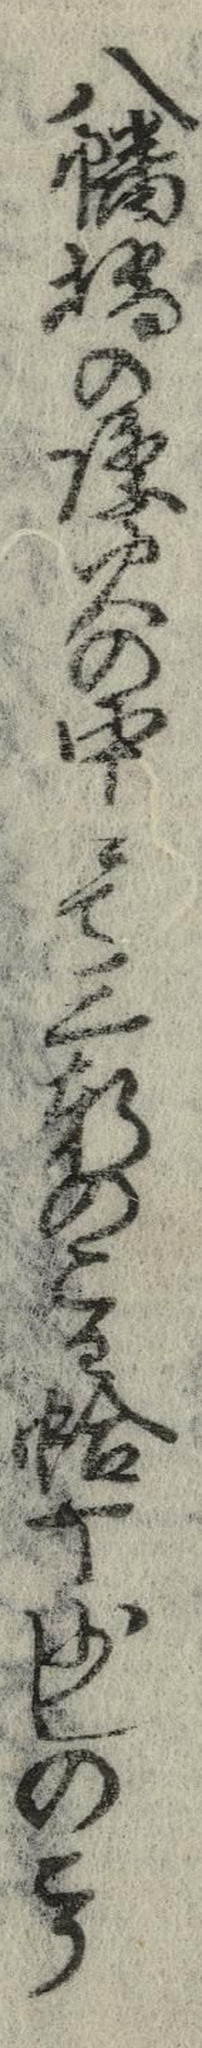八幡橋の際火の中にて三軒のこる蛤丁少しのこり
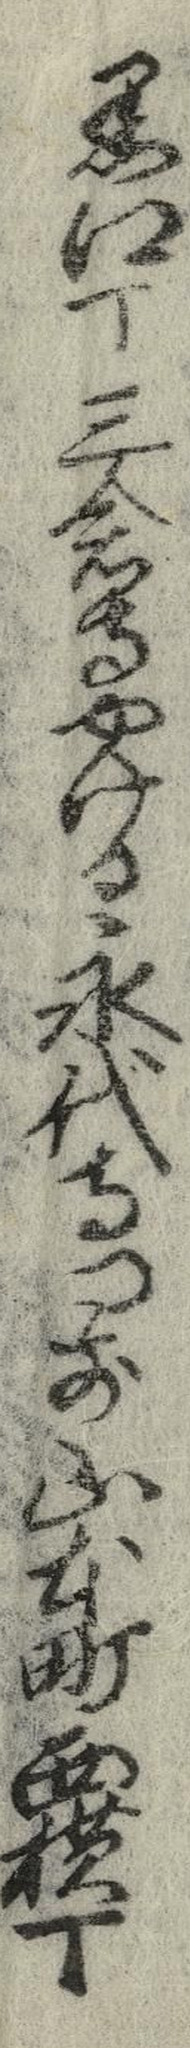黒江丁三倉寺やける永代寺門前山本町西横丁
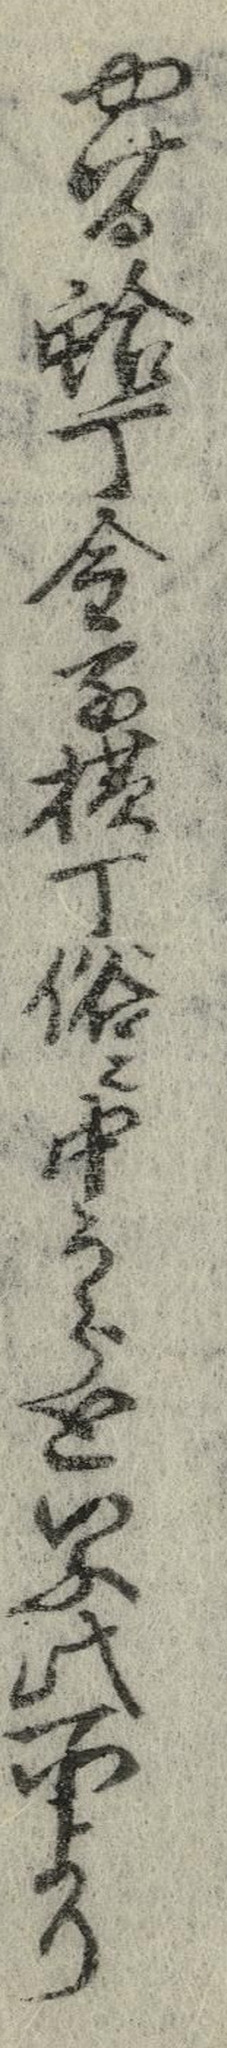やける蛤丁金子横丁俗に中うらといふ此所より
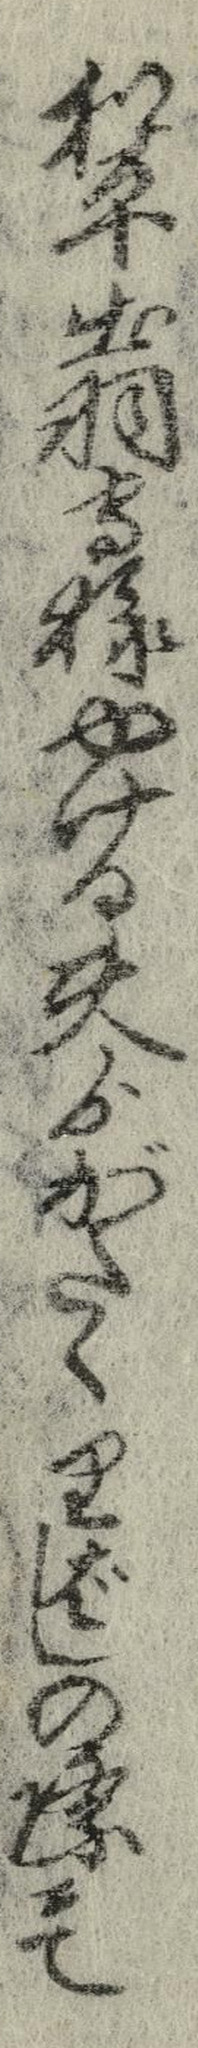松平出羽守様やける夫ゟがたくりばしの際にて
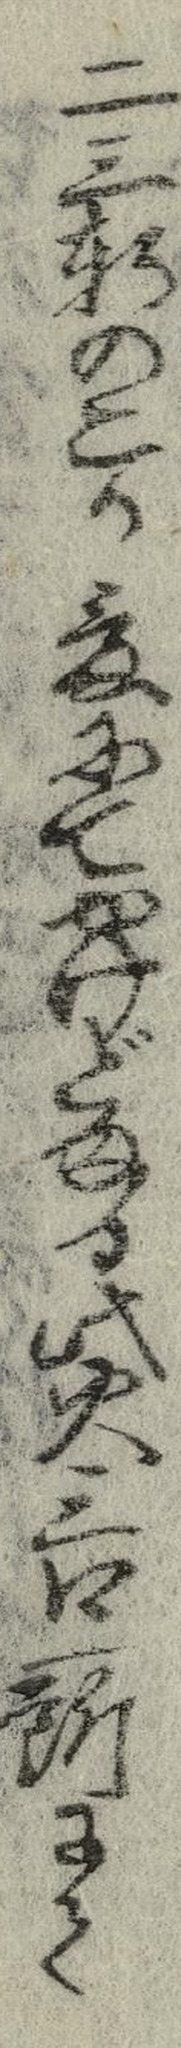二三軒のこり爰にてやけどまる此火三口一所にて
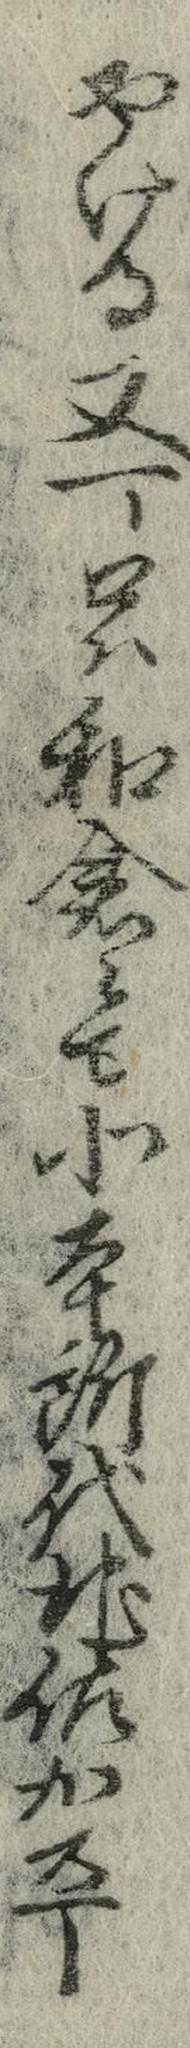やける又一ノ口は和倉にて北本所代地さかの丁
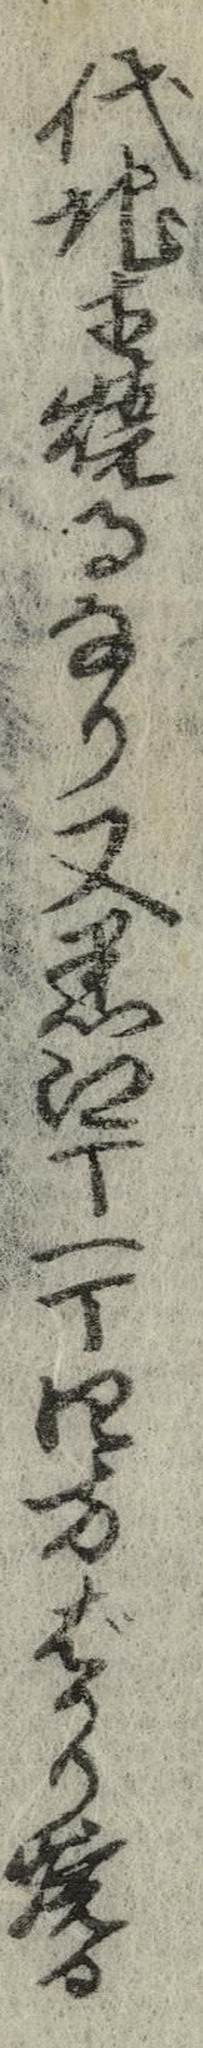代地等焼るなり又黒江丁一丁四方ばかり焼る
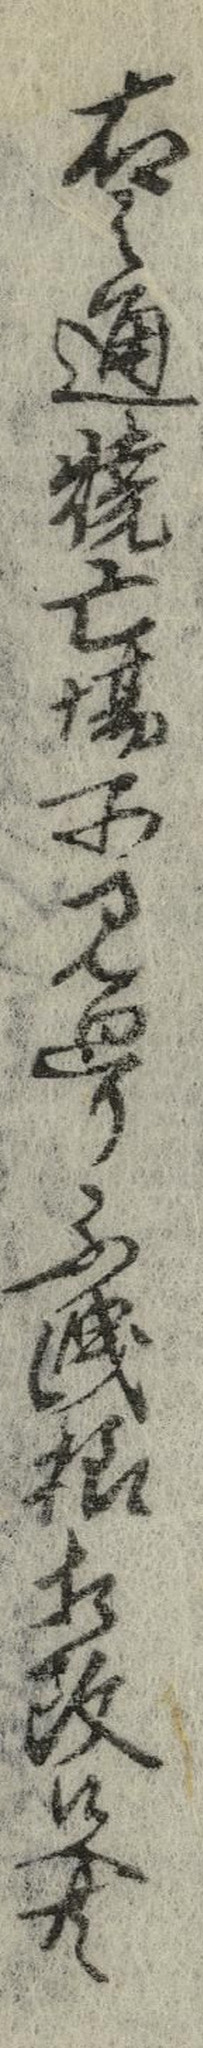右の通焼亡場相見廻り不洩様相改候へ共
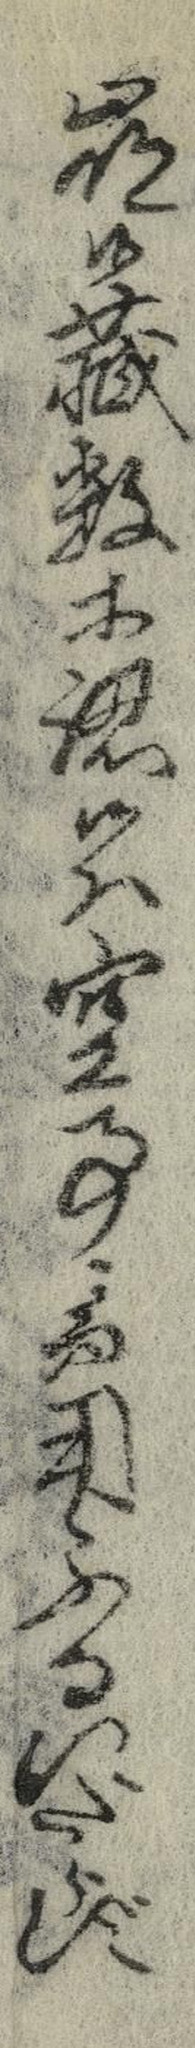崩候蔵数等認候は空事二而用ふるにいたらず
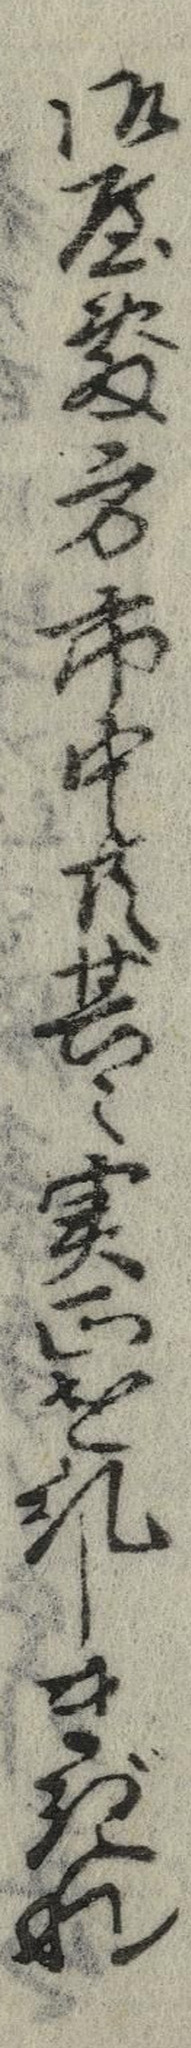御屋敷方市中共其々実正を糺しまぎれ
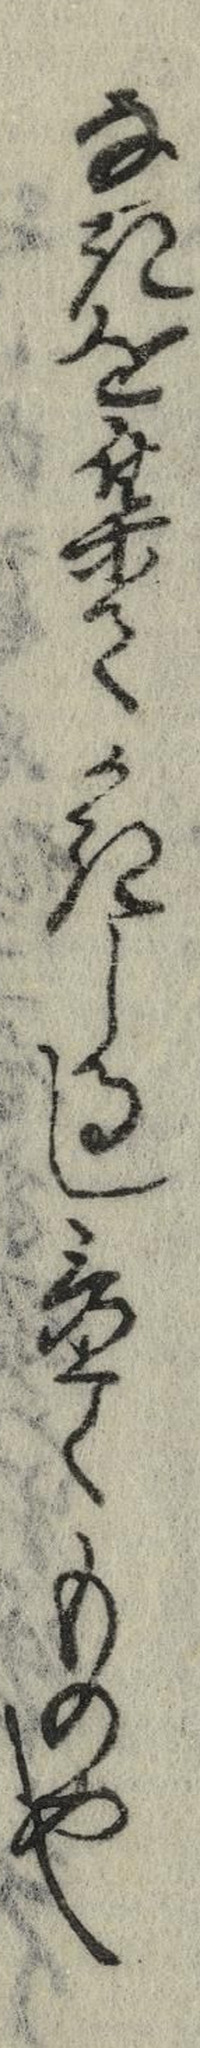なきを集てかきしるし置くもの也
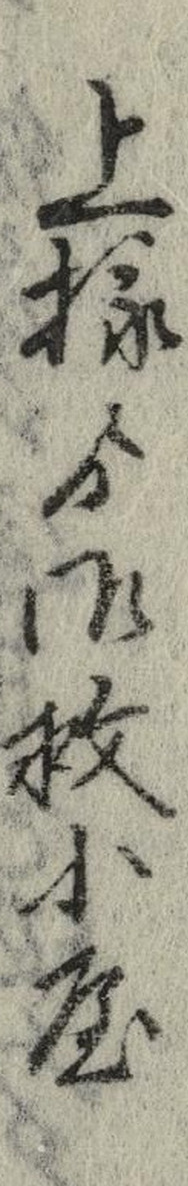上様ゟ御救小屋
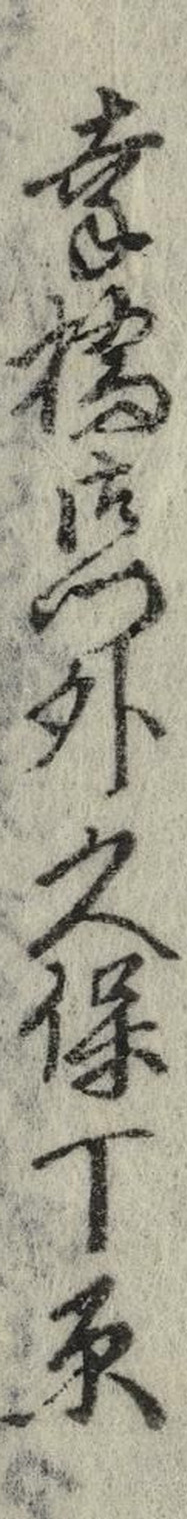幸橋御門外久保丁原
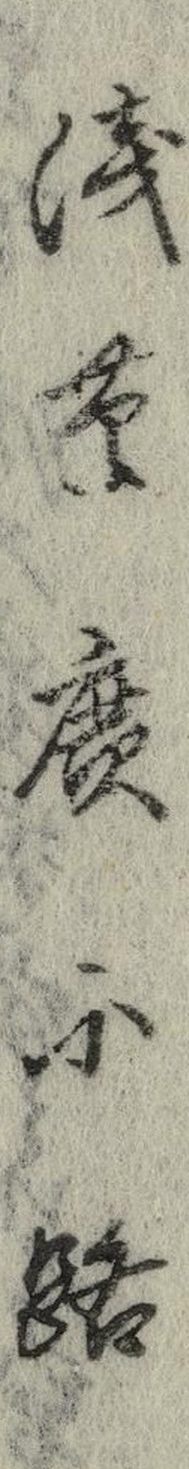浅草広小路
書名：地震類焼場所明細書之写　安政二卯年十月二日夜四ツ時過　御府内御屋敷方市中共、并街道筋近郷聞書
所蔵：東京大学地震研究所図書室 Earthquake Research Institute Library, The University of Tokyo, JAPAN
